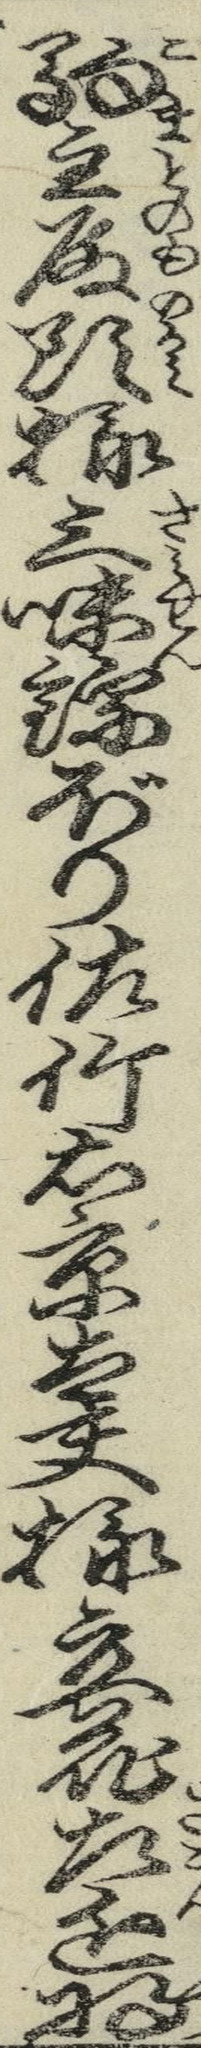駒主殿頭様三味線ぼり佐竹右京太夫様立花左近将
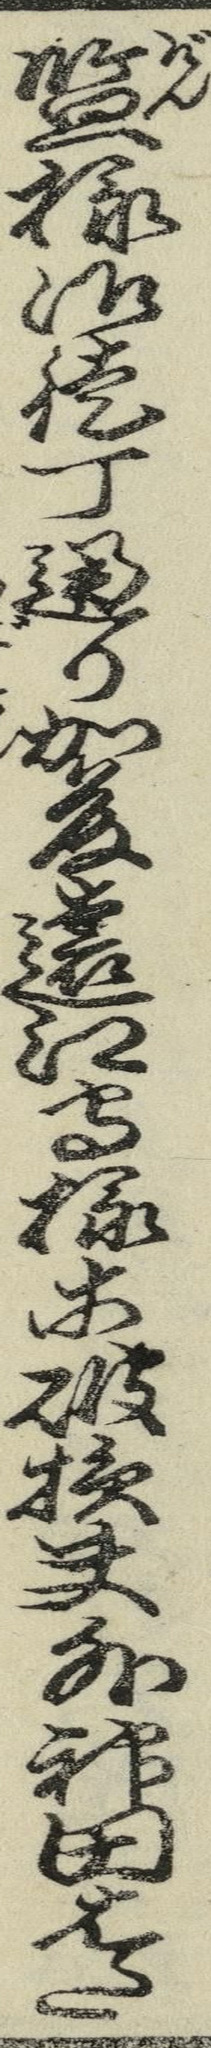監様御徒丁通り加藤遠江守様等破損夫外神田はた
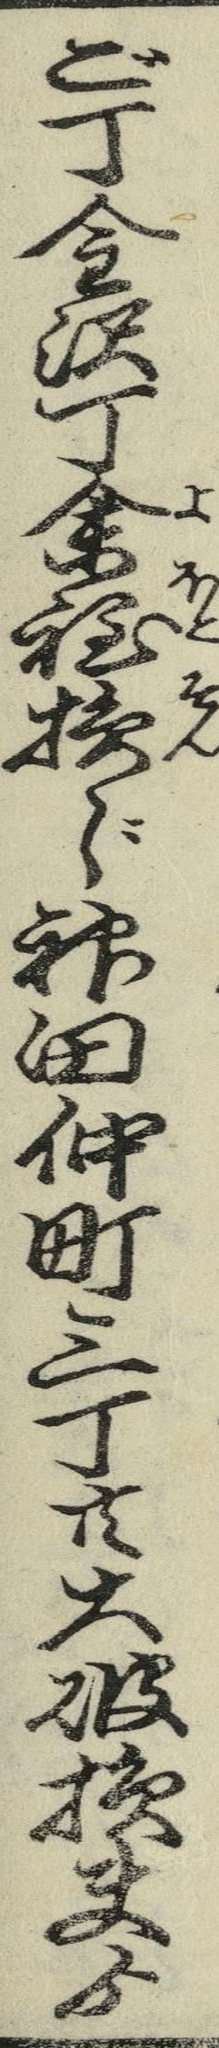ご丁金沢丁余程損じ神田仲町三丁共大破損夫ゟ
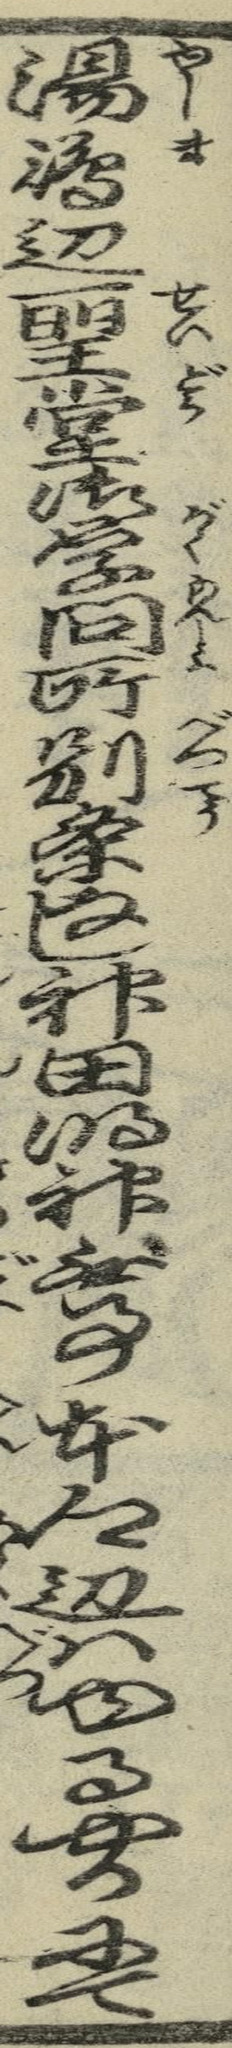湯島辺聖堂御学問所別条なし神田明神無事本道辺はゆるやかにて
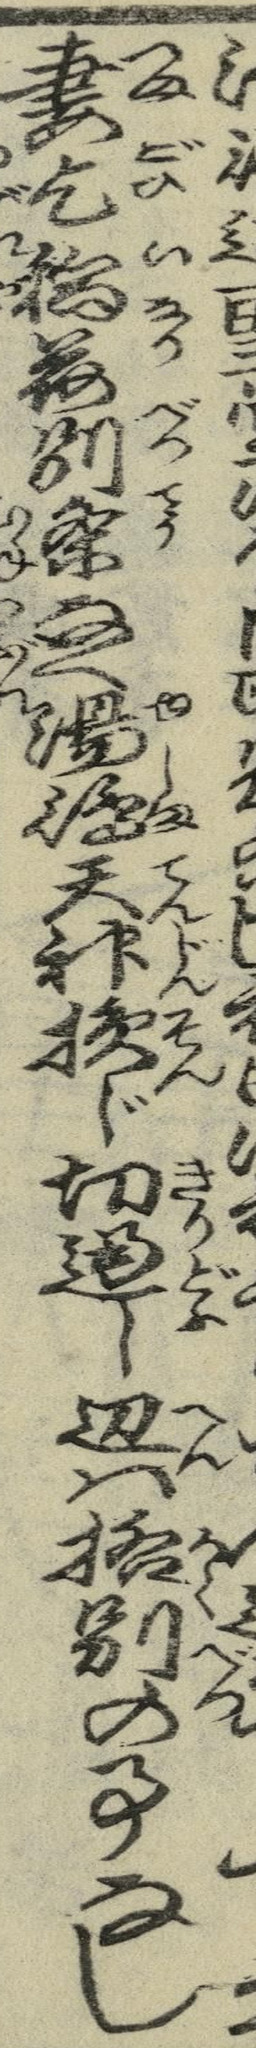妻乞稲荷別条なく湯島天神損じ切通し辺は格別の事なし
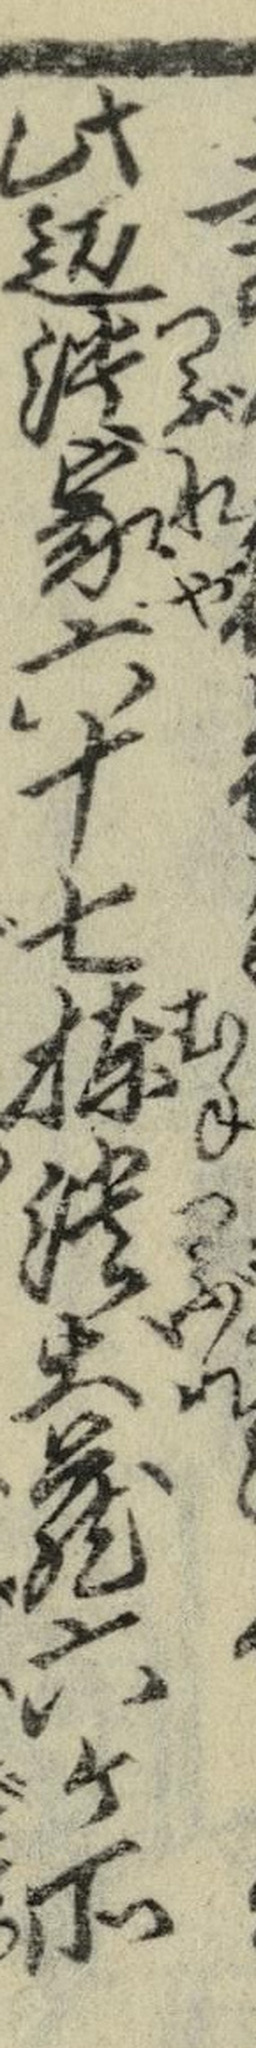此辺潰家六十七棟潰土蔵六ケ所
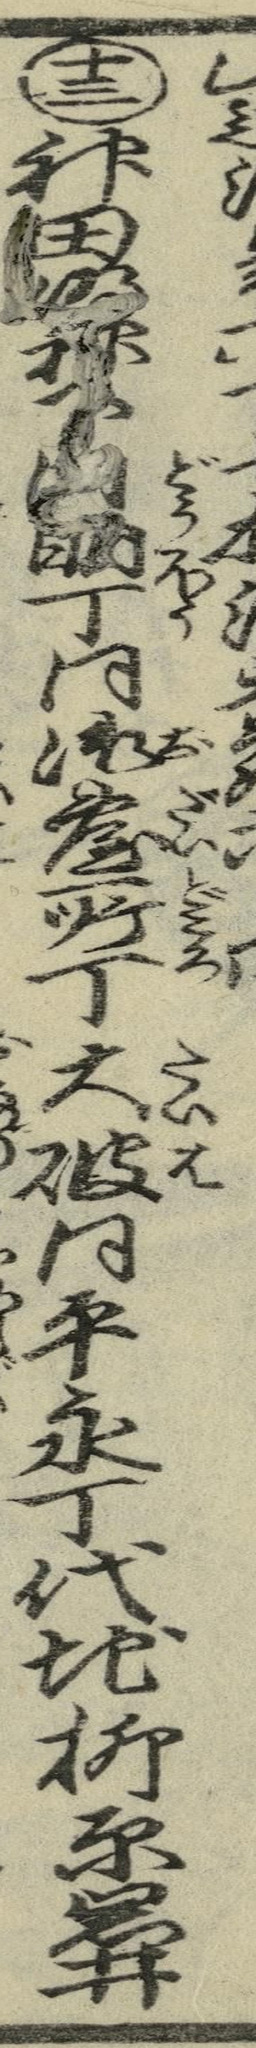十三神田明神同朋丁同御台所丁大破同平永丁代地柳原岩井
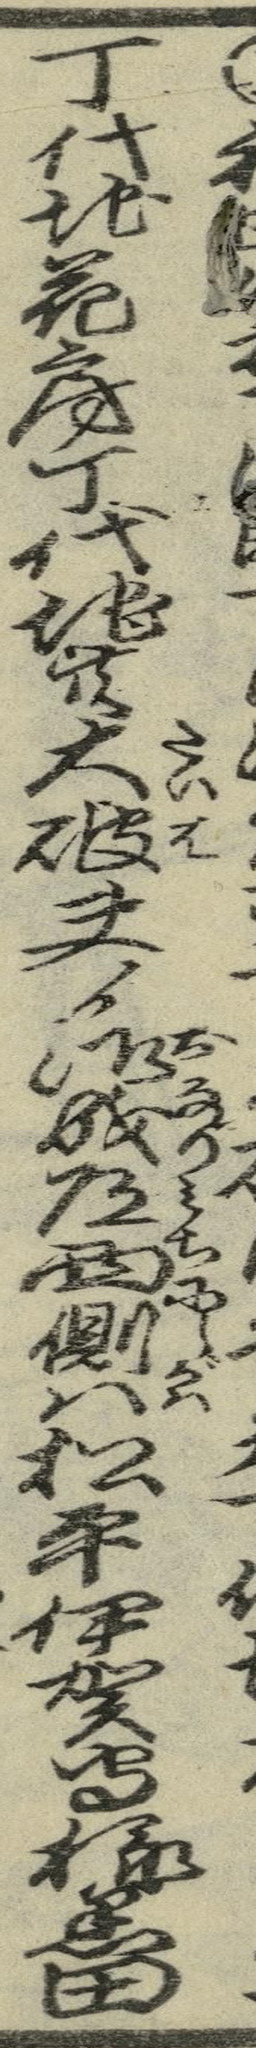丁代地花房丁代地共大破夫ゟ御成道西側松平伊賀守様黒田
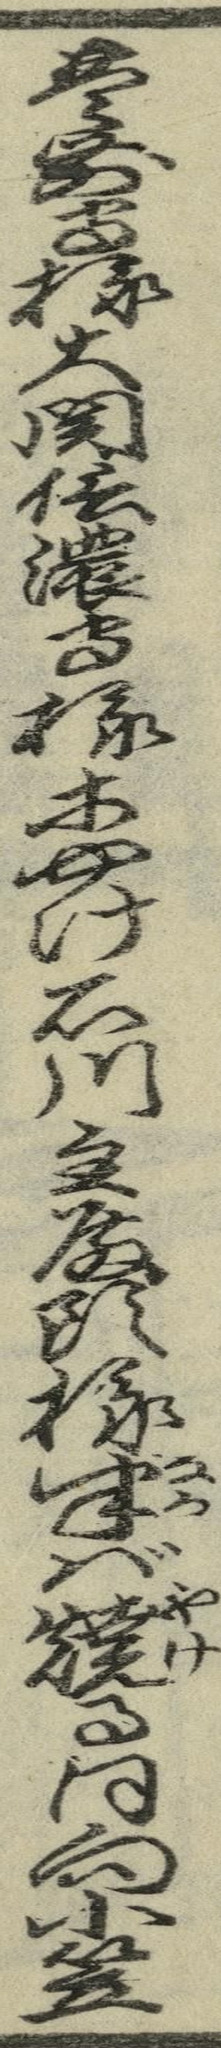豊前守様大関信濃守様等やけ石川主殿頭様半ば焼る同向小笠
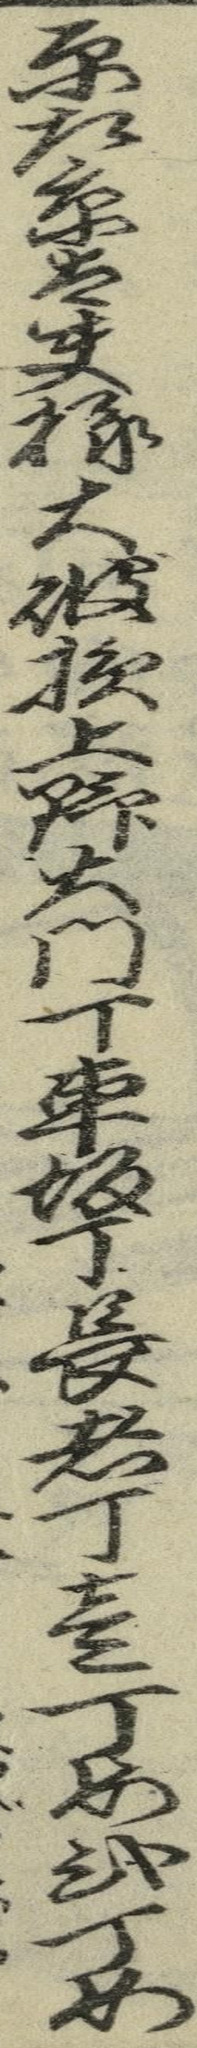原左京太夫様大破損上野大門丁車坂丁長者丁壱丁め弐丁め
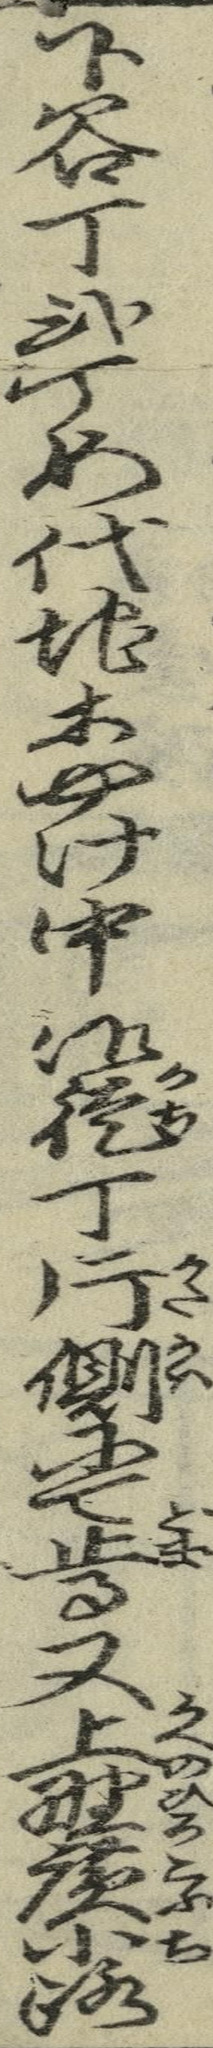下谷丁弐丁め代地等やけ中御徒丁片側にて止る又上野広小路
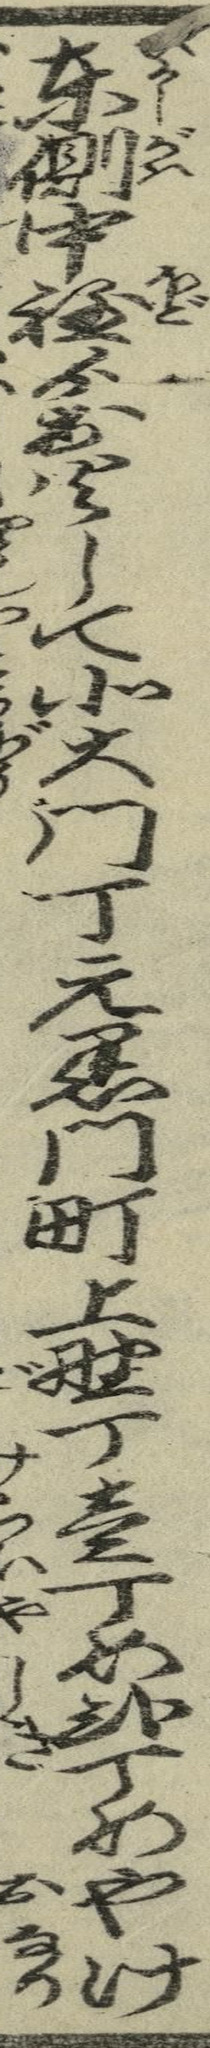東側中程ゟ出火して北大門丁元黒門町上野丁壱丁め弐丁めやけ
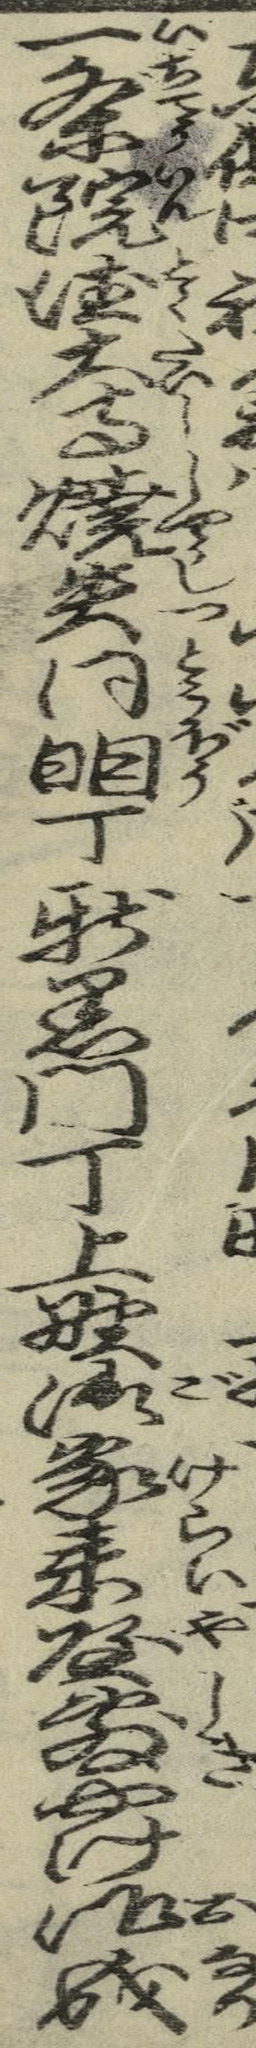一条院徳大寺焼失同朋丁新黒門丁上野御家来屋敷やけ御成
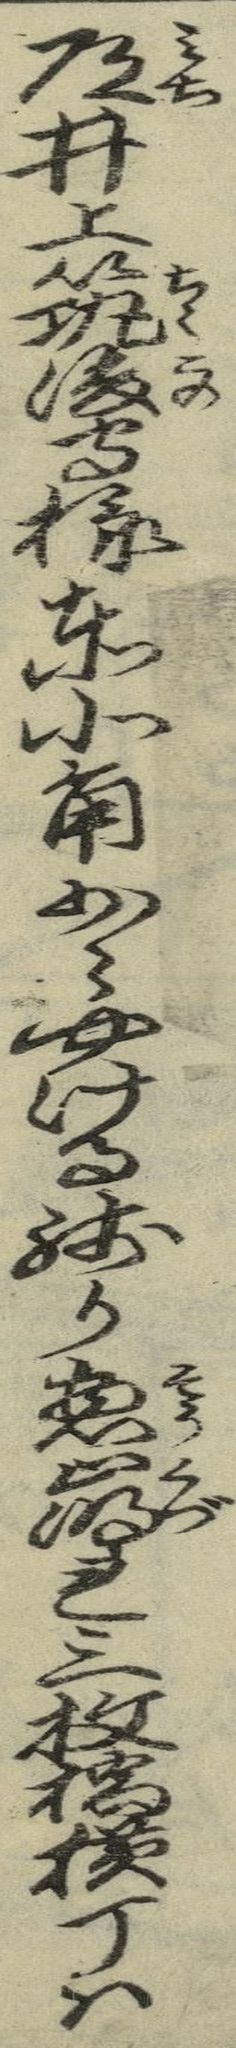道井上筑後守様東北南少々やける残り惣崩れ三枚橋横丁は

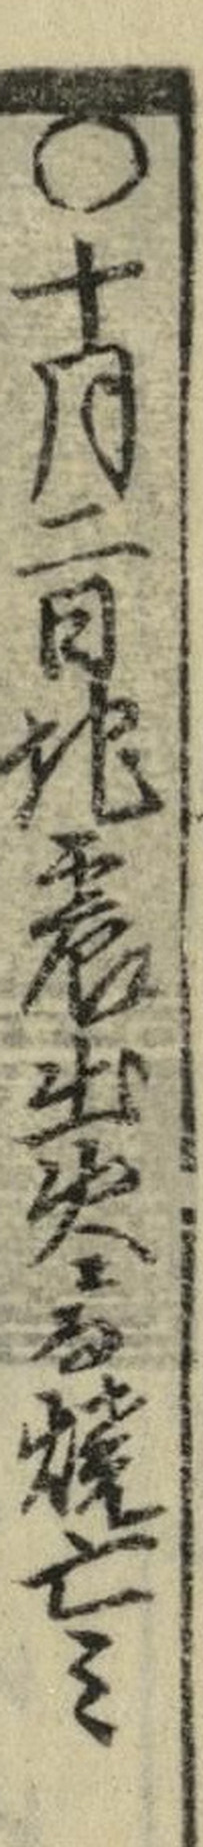〇十月二日地震出火ニ而焼亡之
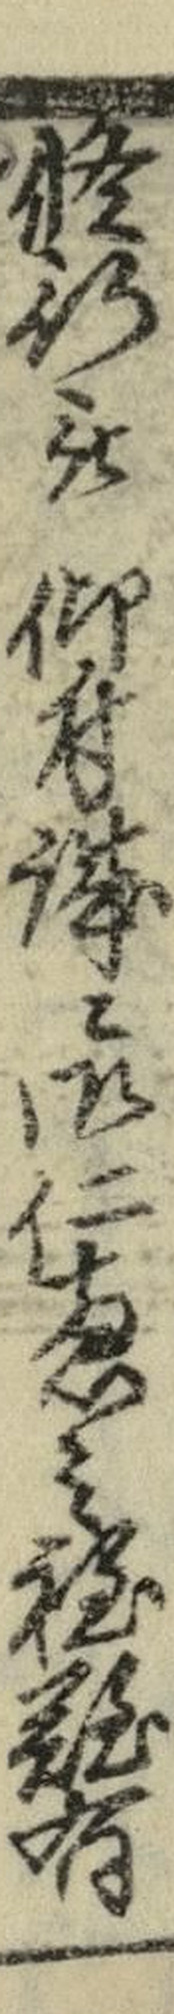修行被仰付誠ニ御仁恵之程難有
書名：地震年代記
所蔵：東京大学地震研究所図書室 Earthquake Research Institute Library, The University of Tokyo, JAPAN
